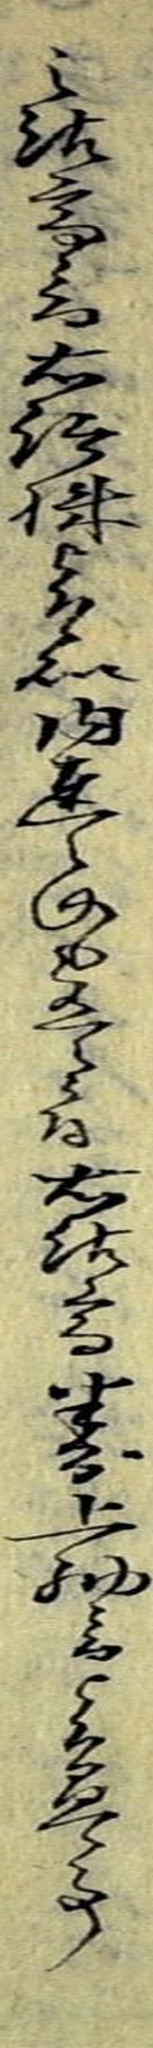之銀高に而右跡株被下候処内達之趣も有之候に付右銀高半分上納に而被下置候事
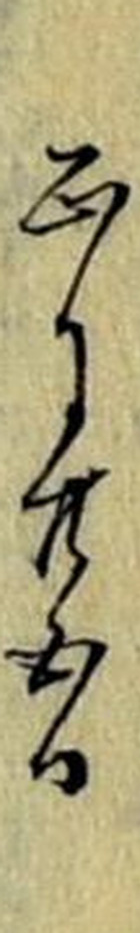正月廿五日

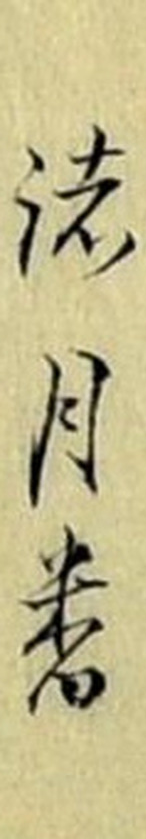諸月番
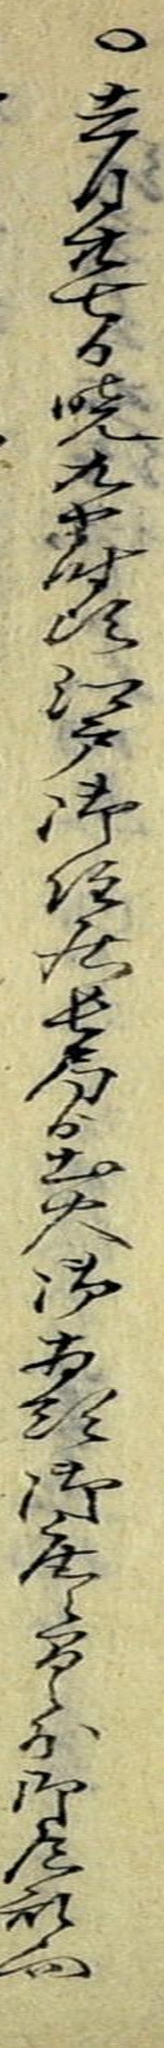○去月廿七日暁九半時頃江戸御住居長局ゟ出火御拝領御座之間之外御屋形向
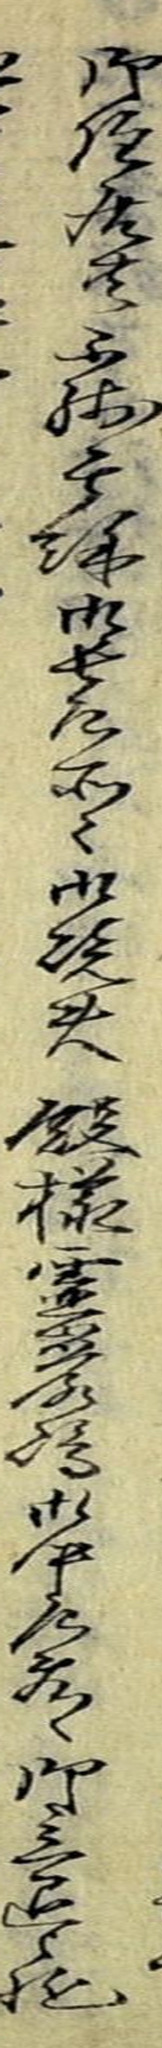御住居共不残其餘御長屋所々御焼失殿様霊厳嶋御中屋敷へ御立退被遊
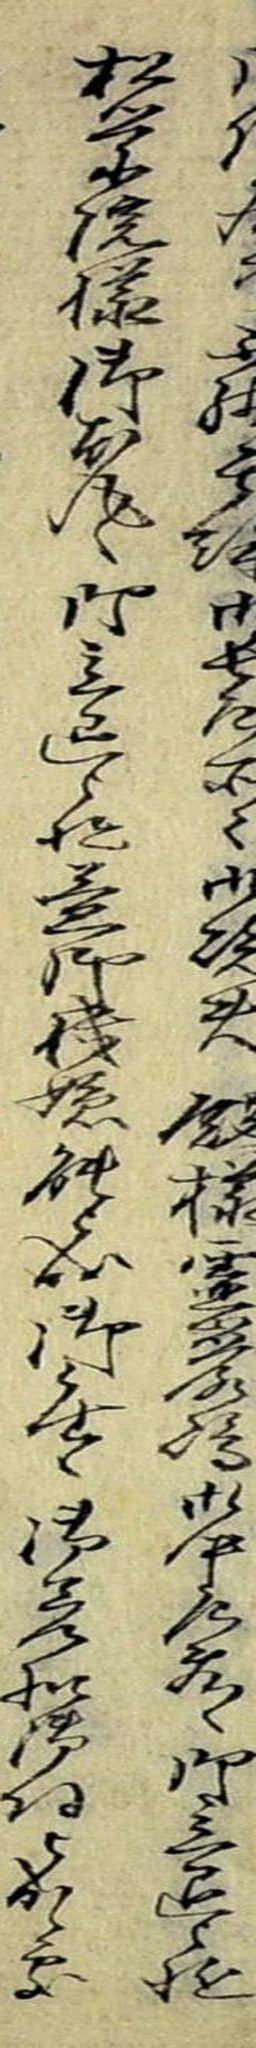松栄院様御本丸へ御立退被遊益御機嫌能被成御座候御差扣御伺被成候処
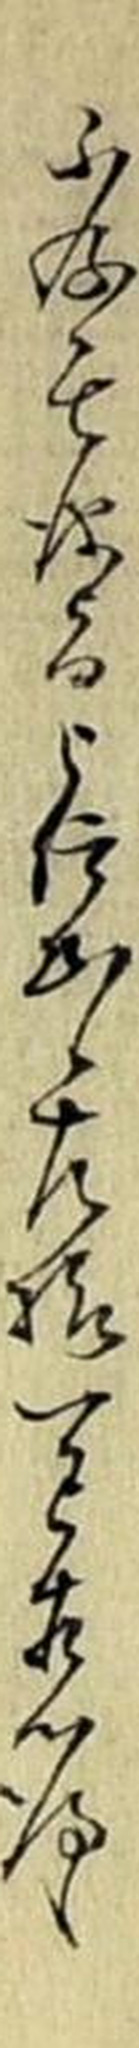不及其儀侯旨被仰出候左様可被相心得候
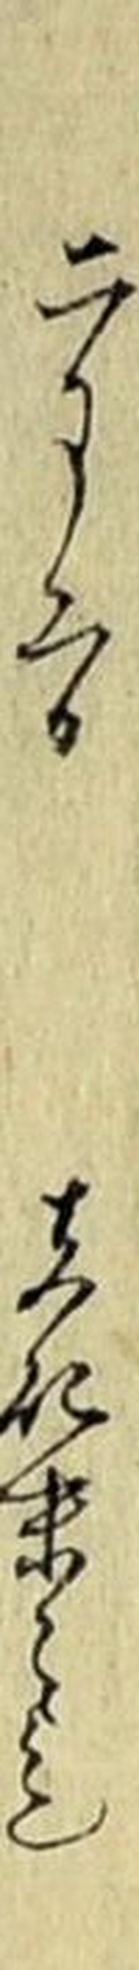二月二日支配末々迄
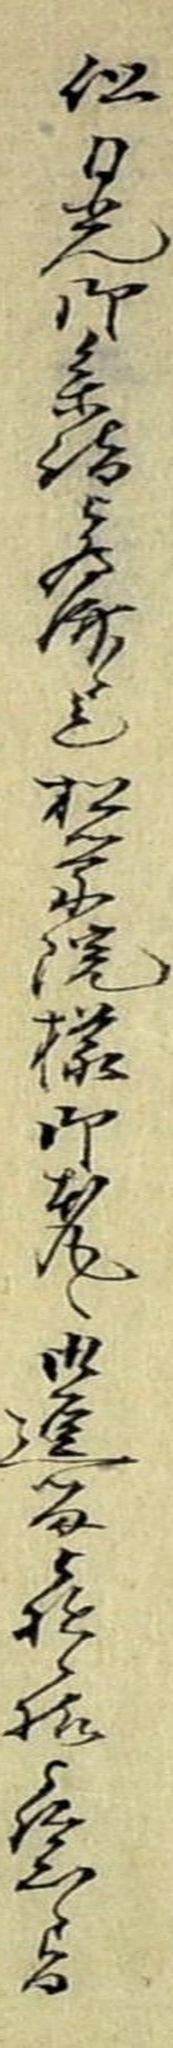但日光御参詣被為済候迄松栄院様御本丸へ御逗留被遊候様被仰出候旨
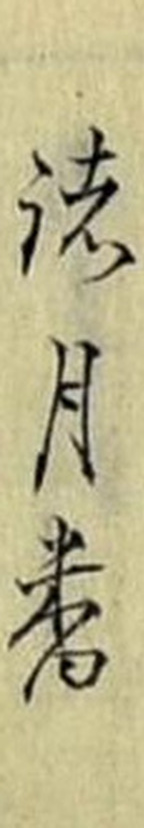諸月番
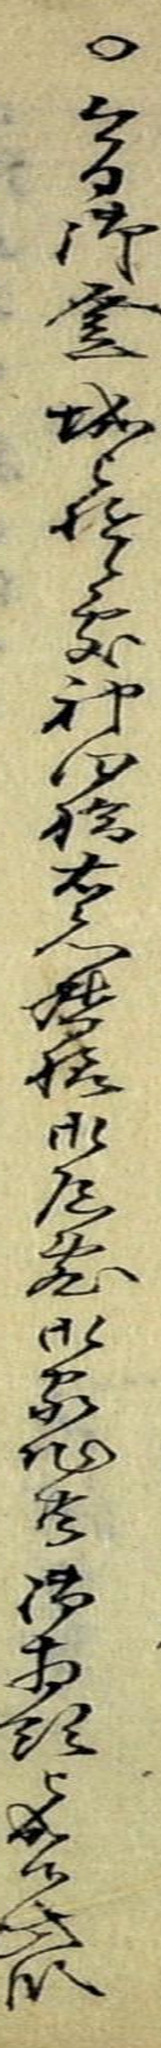○今日御登城被遊候処神田橋右衛門卿督様御屋敷御家作共御拝領被成候此段
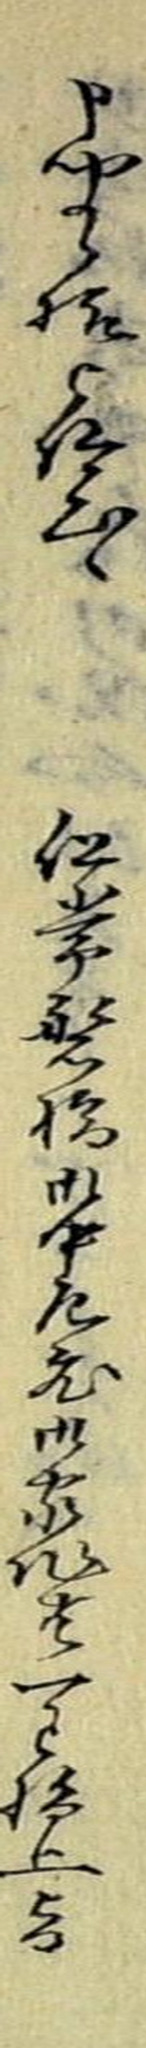申聞候様被仰出候但常盤橋御中屋敷御家作共可被指上旨
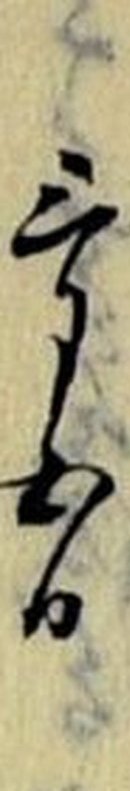三月五日
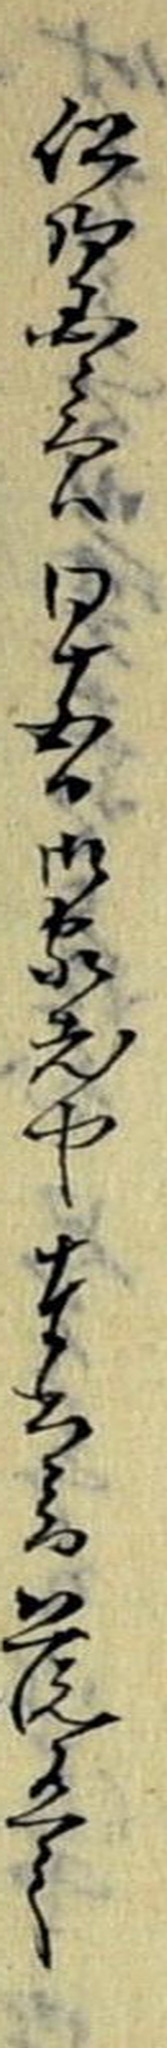但御国に而は同十五日御家老中奉書に而恐悦有之
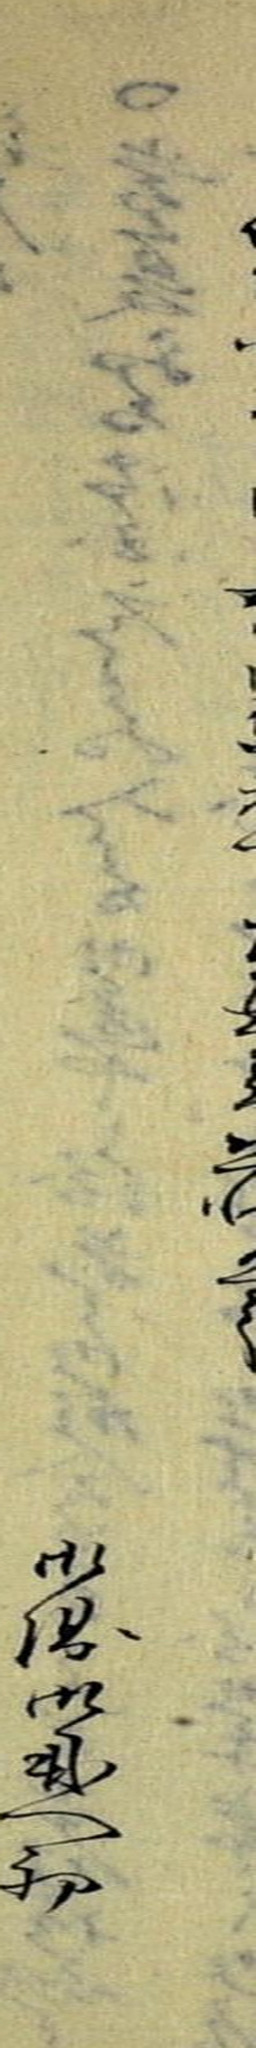御側御用人初
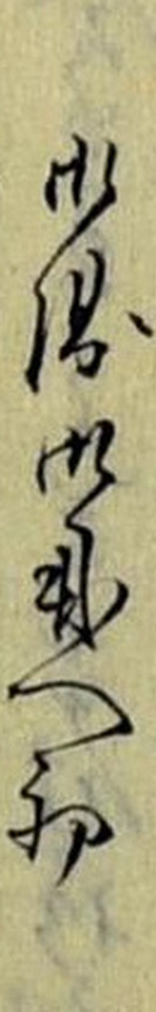御側御用人初
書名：命令之部 六
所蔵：福井県文書館 Fukui Prefectural Archives
